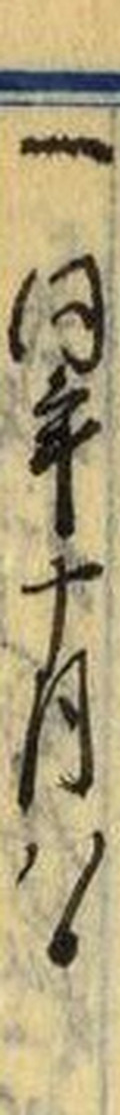一同年十月八日

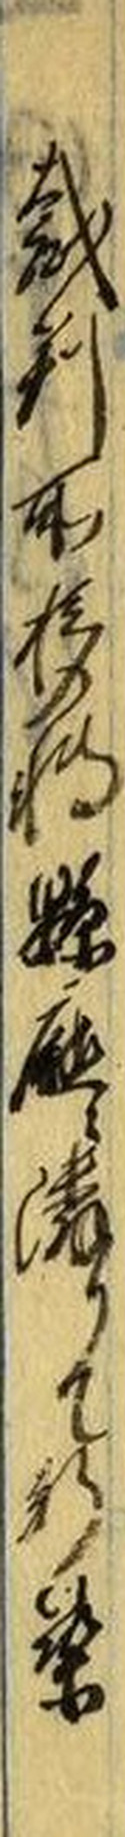裁判所移転県庁に隣りて新築
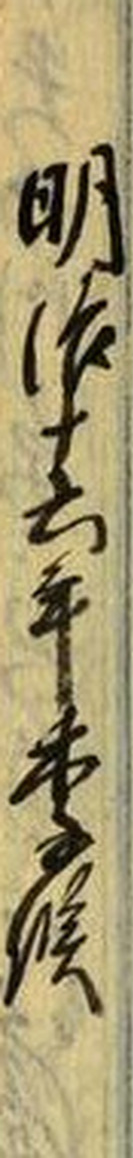明治十六年季候
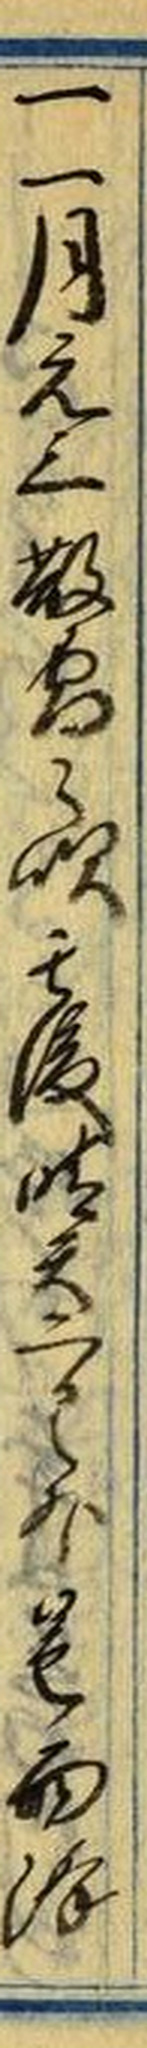一一月元旦散雪々吹其後晴天二日之外曇雨降
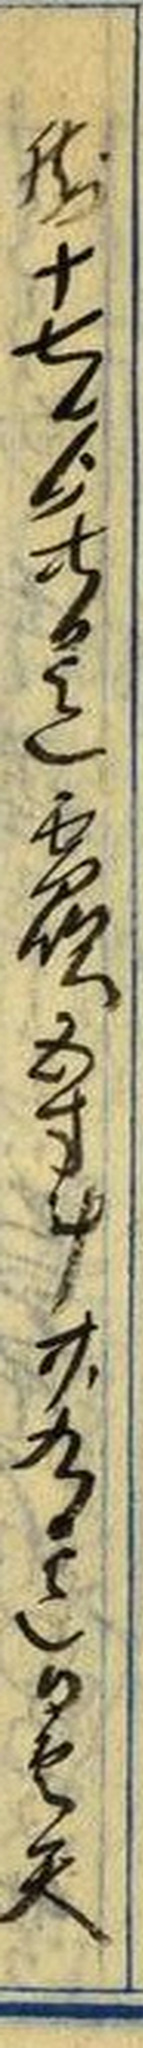勝十七日ゟ廿日迄雪吹五寸計廿九日迄曇天
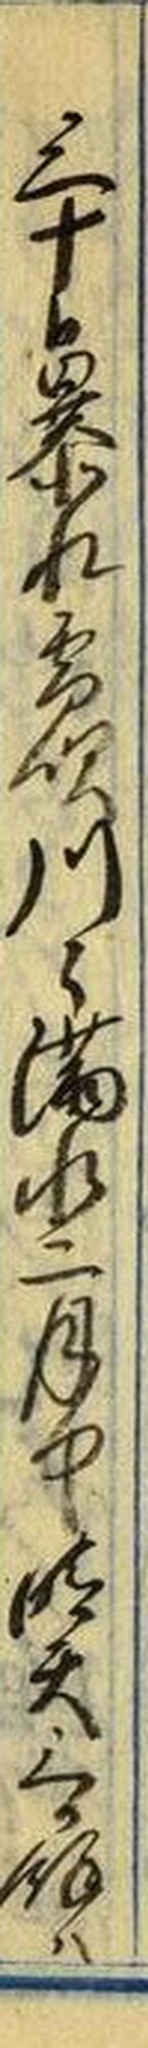三十日暴れ雪吹川々満水二月中晴天三日餘は
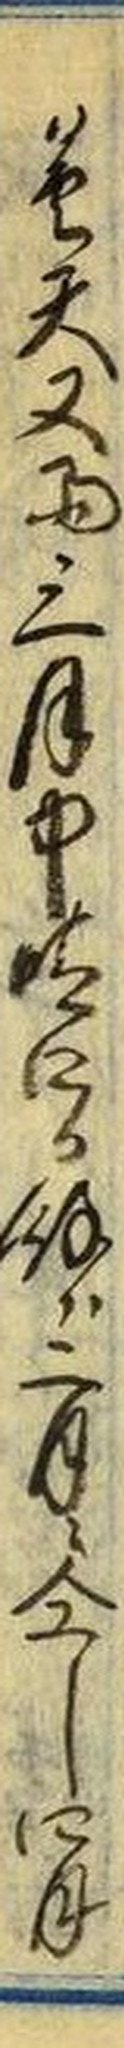曇天又雨三月中晴四日餘は二月に仝し四月
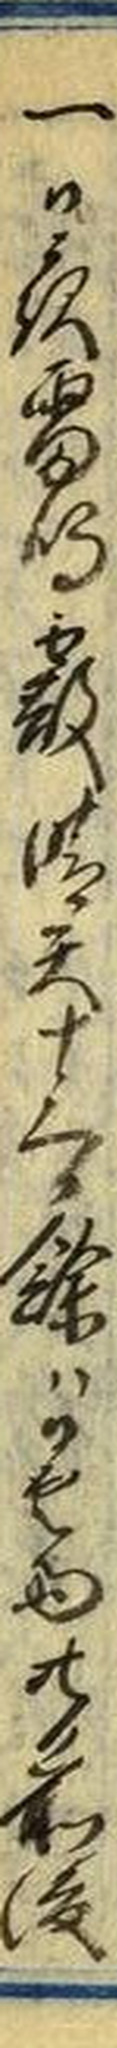一日夜雷鳴霰晴天十三日餘は曇雨廿日前後
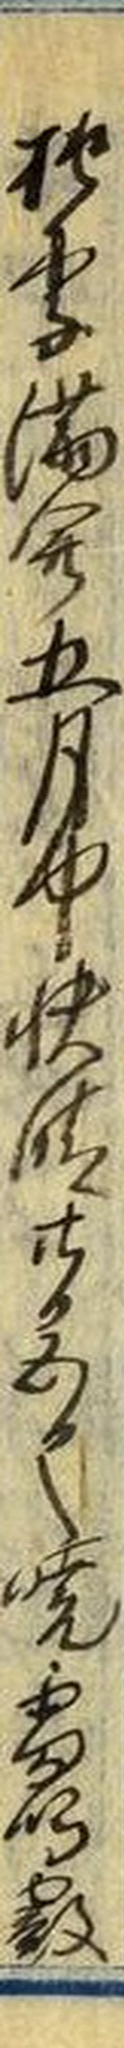桃李満開五月中快晴廿五日之暁雷鳴霰
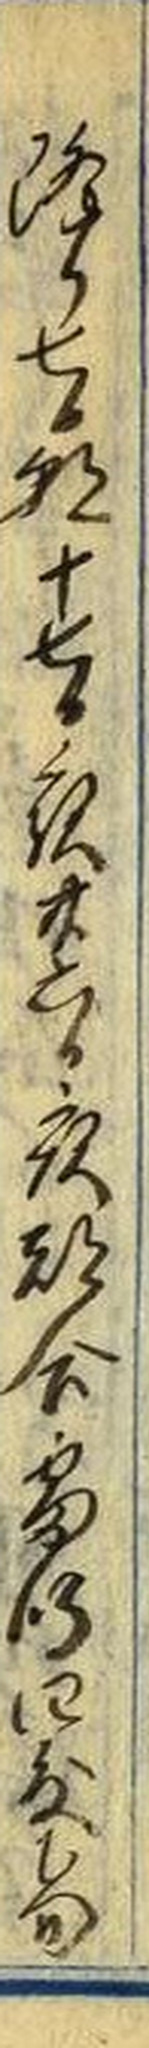降り七日朝十七日夜廿六日夜都合雷鳴四度下旬
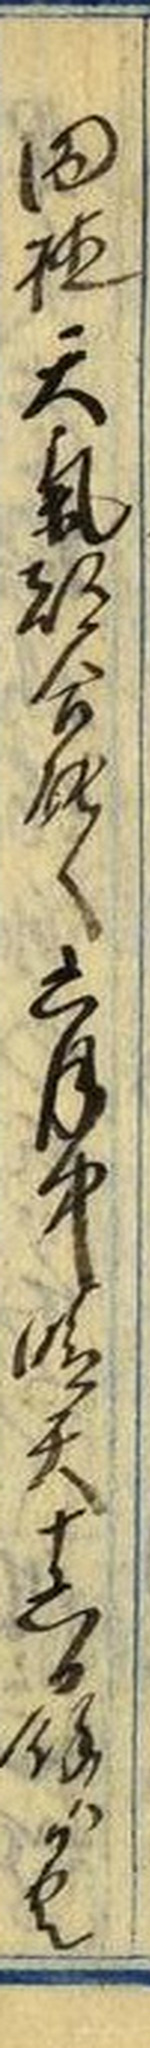田植天気都合能く六月中晴天十六日餘は曇
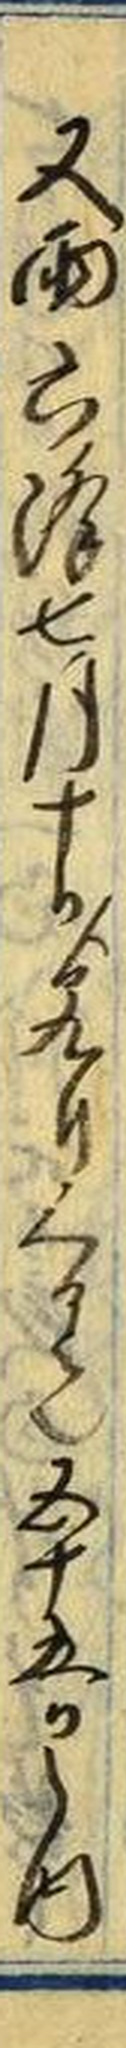又雨六降七月十日ゟ九月三日迄五十五日之内

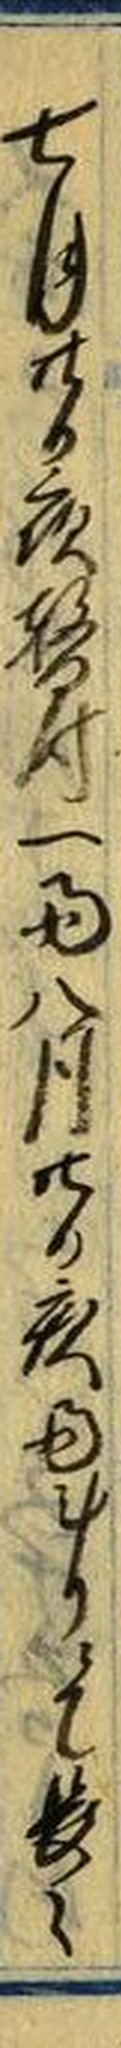七月廿日夜暫時一雨八月廿日夜雨計りにて長々
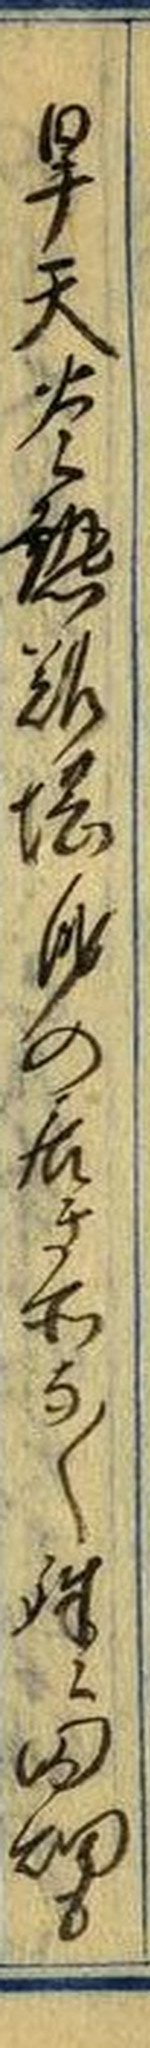旱天炎熱難堪身の置き所なく殊に田畑も
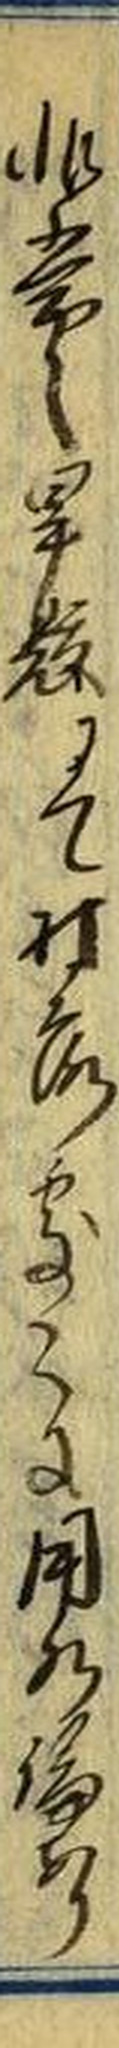非常之旱魃にて村落処々に用水端あり
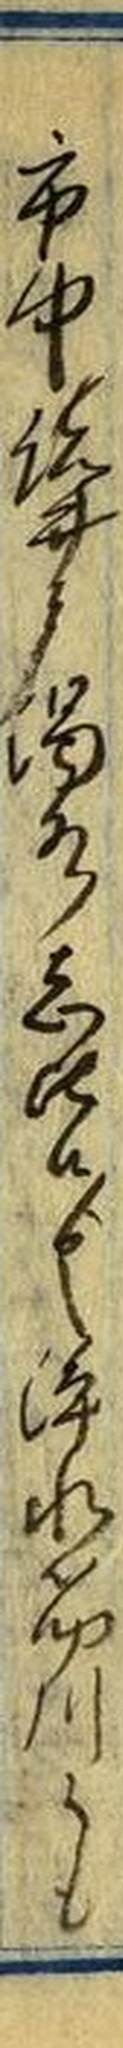市中諸井戸渇水志地口ゟ之浄水筋川にも
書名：温古集 五巻
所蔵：福井県文書館 Fukui Prefectural Archives
